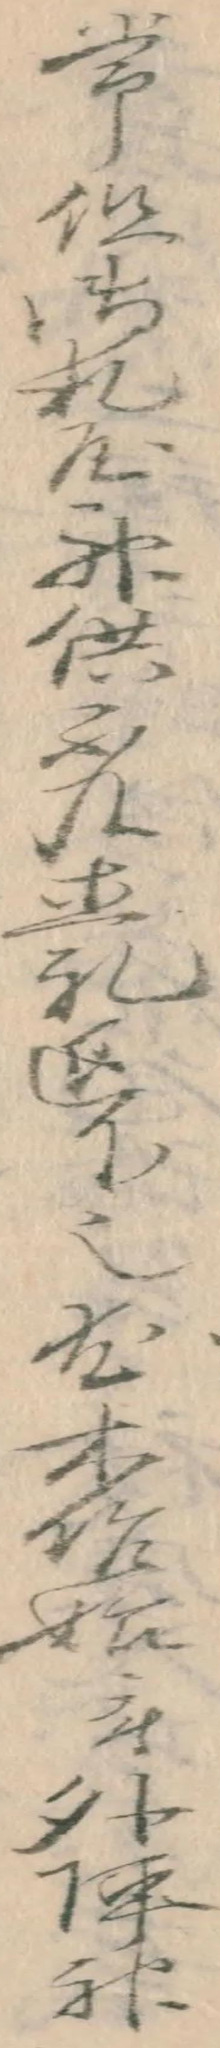常但御札屋神供不罷直礼返下也尤木作始ニ付外陣神
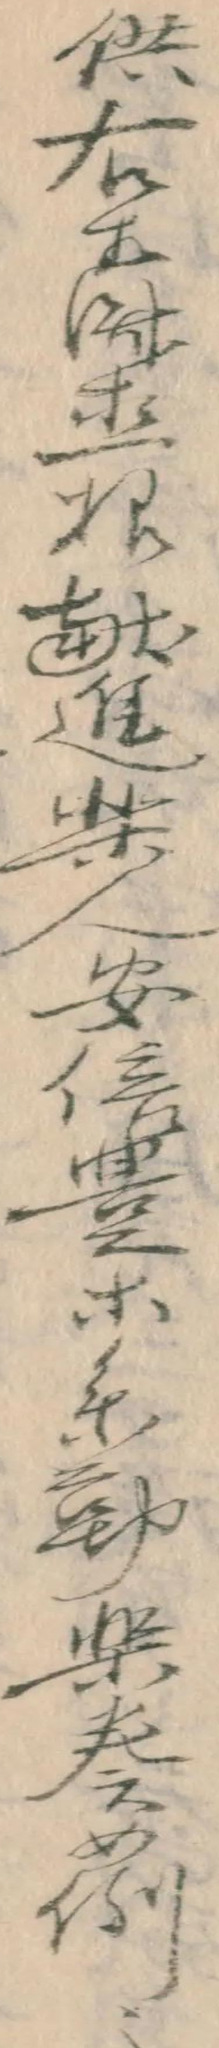供右相済直様献進楽人安倍豊等参勤楽奏如例也
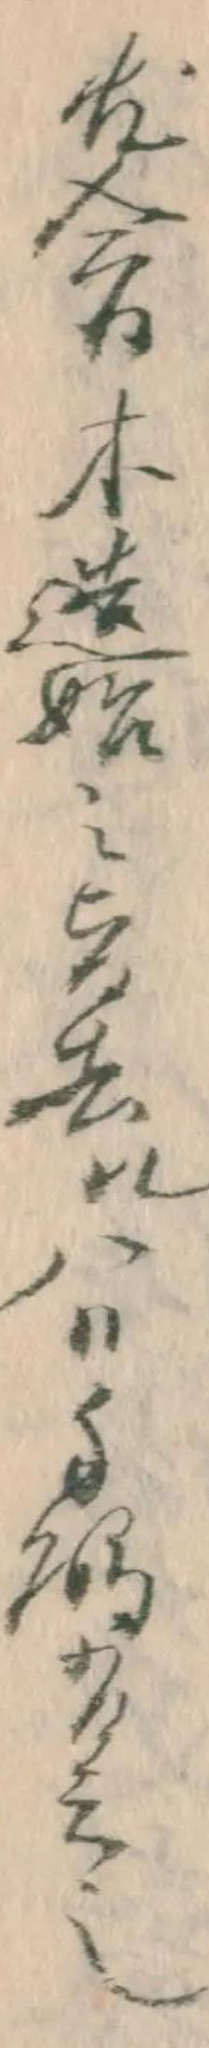尤今日本造始之旨去ル八日手觸有之也
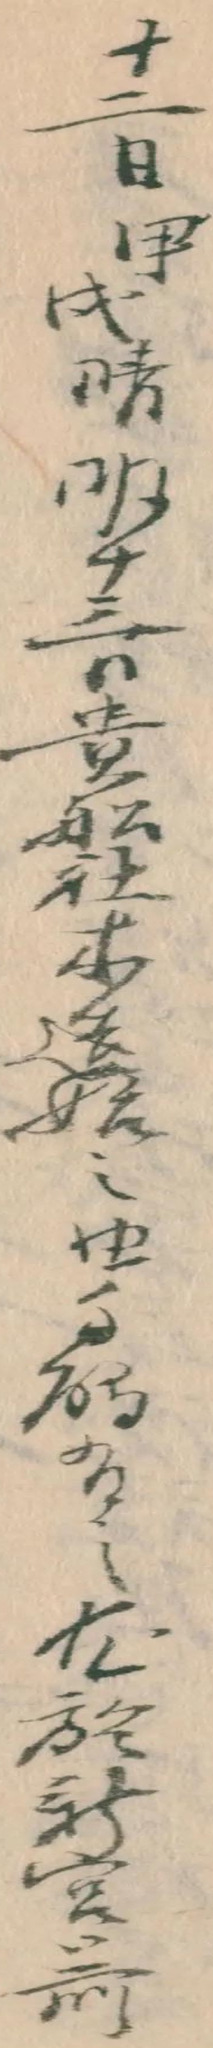十二日甲戌晴明十三日貴舩社木造始之由手觸有之尤於新宮御前
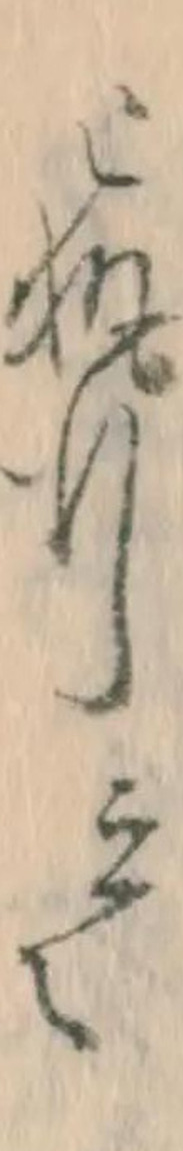被執行云々
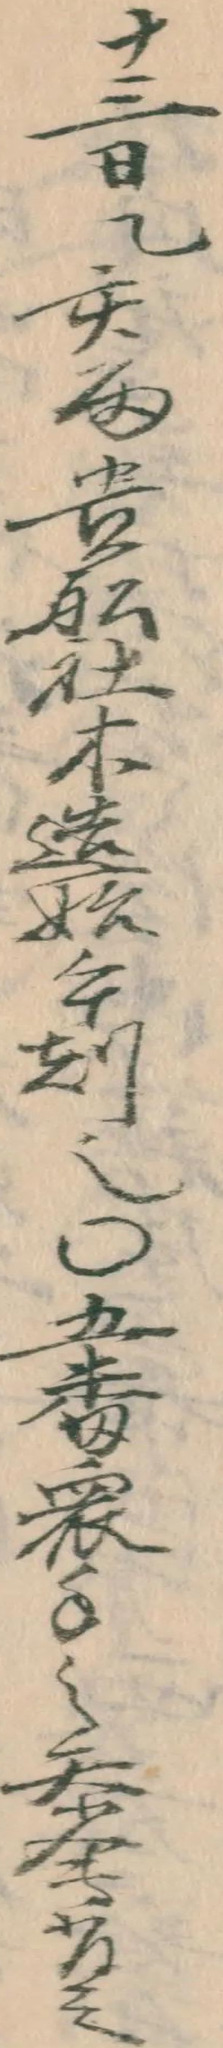十三日乙亥雨貴舩社木造始午刻也○五番衆手之参會有之
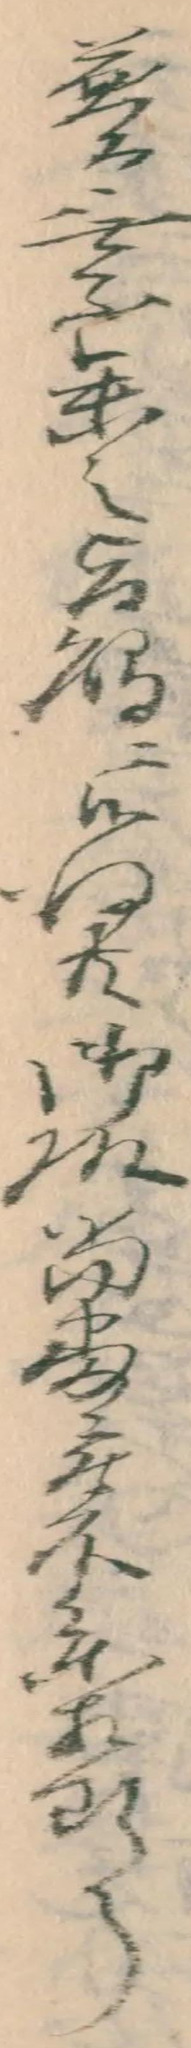兼而無不参之旨觸に候得共御殿當番ニ付不参相断了
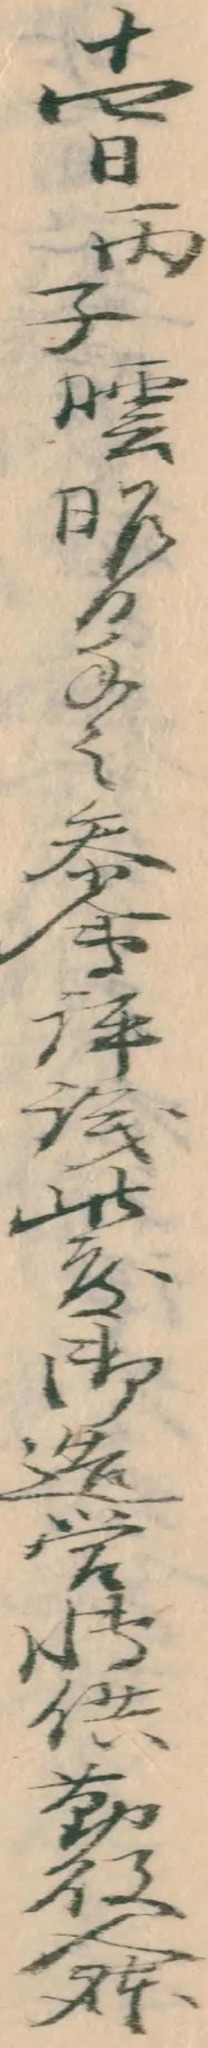十四日丙子雲昨日手之参會評議此度御造営轉供勤役人躰
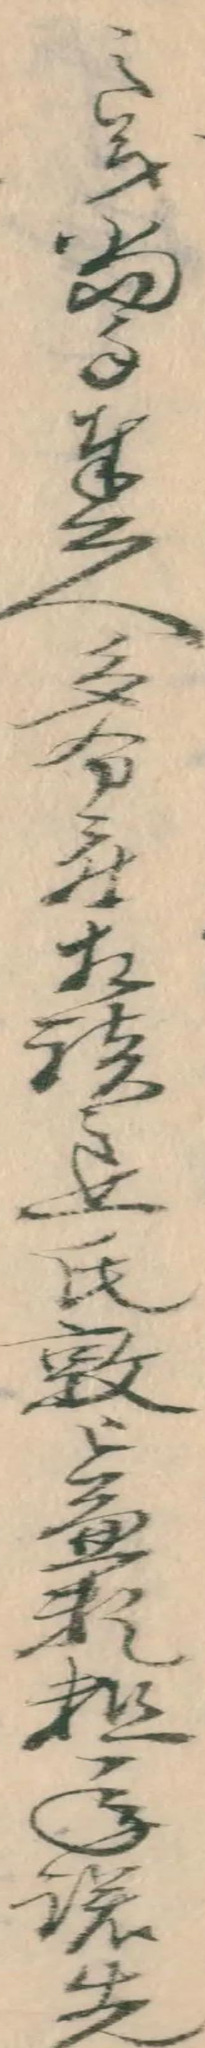之義當手奉公人多分ニ付相談之上氏敦被兼頼粗承諾先
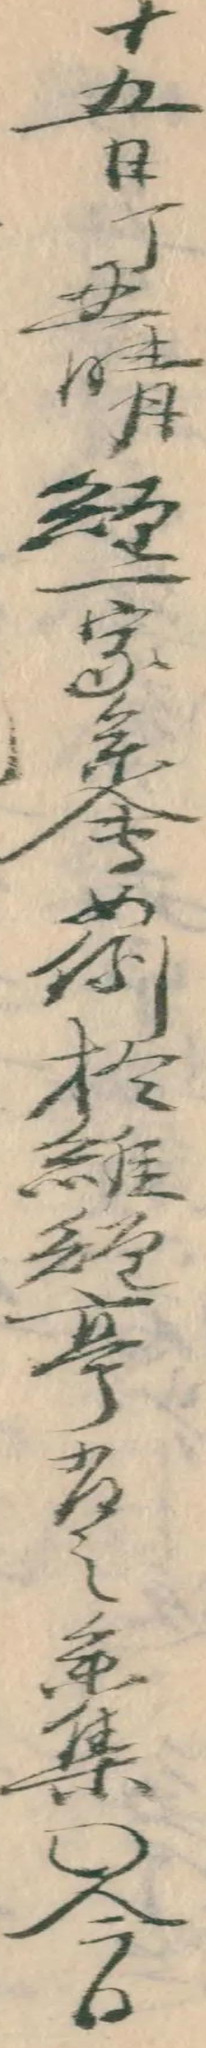十五日丁丑晴経一家参會如例於維経亭有之参集○今日
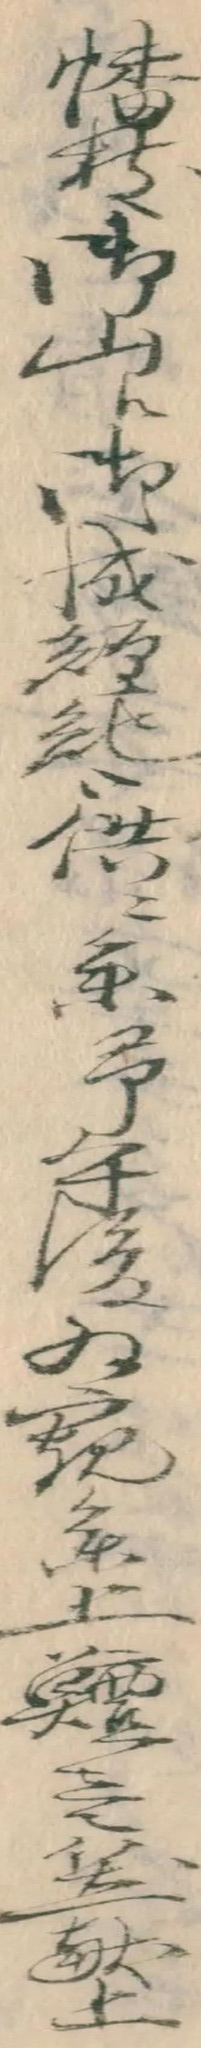幡枝御山え御成経紀御供ニ参予午後為窺参上鱈壱盆献上
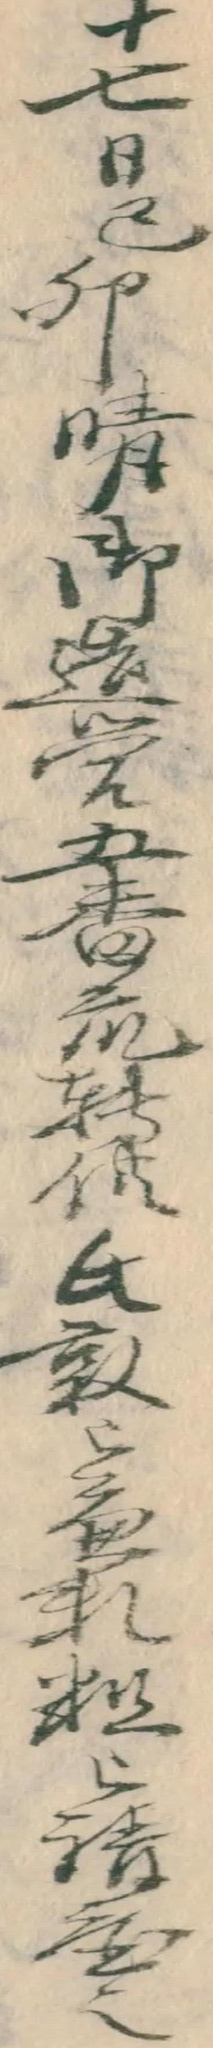十七日己卯晴御遠営五番衆轉供氏敦被兼頼粗被請置之
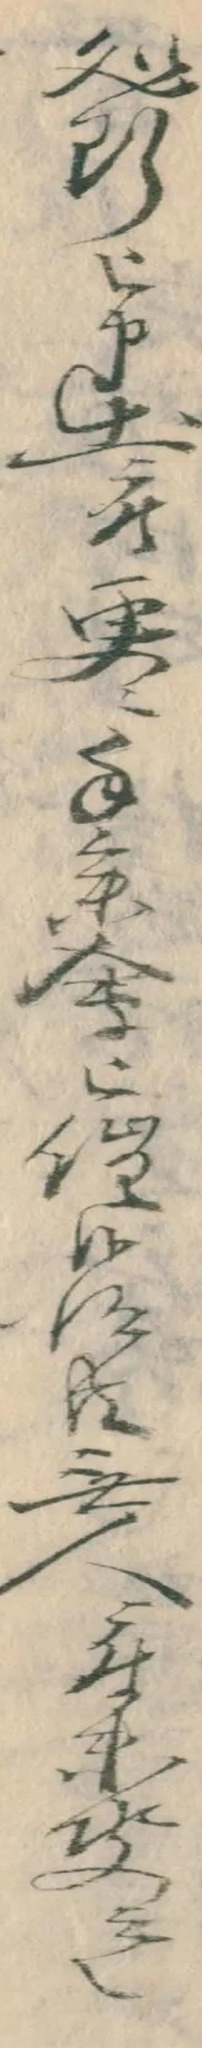処断被申出ニ付更ニ手参會被催候得共無人ニ付未決而之
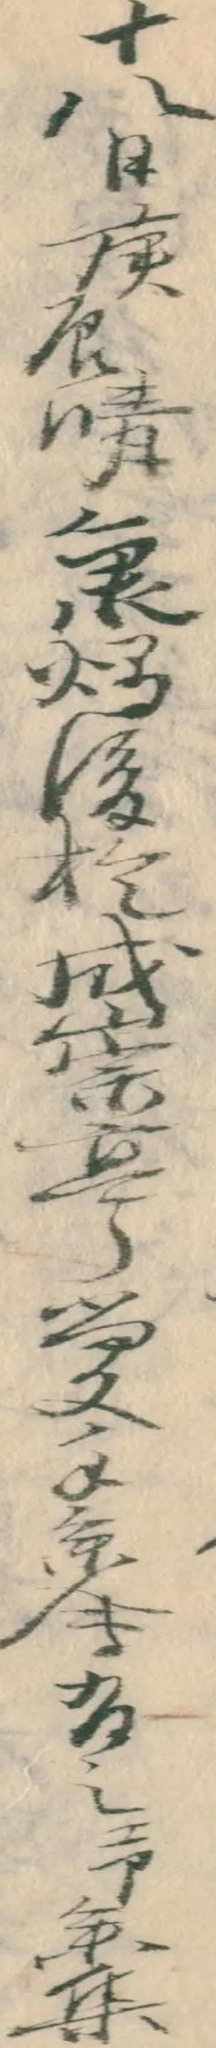十八日庚辰晴秉燭後於成崇亭尚又手参會有之予参集
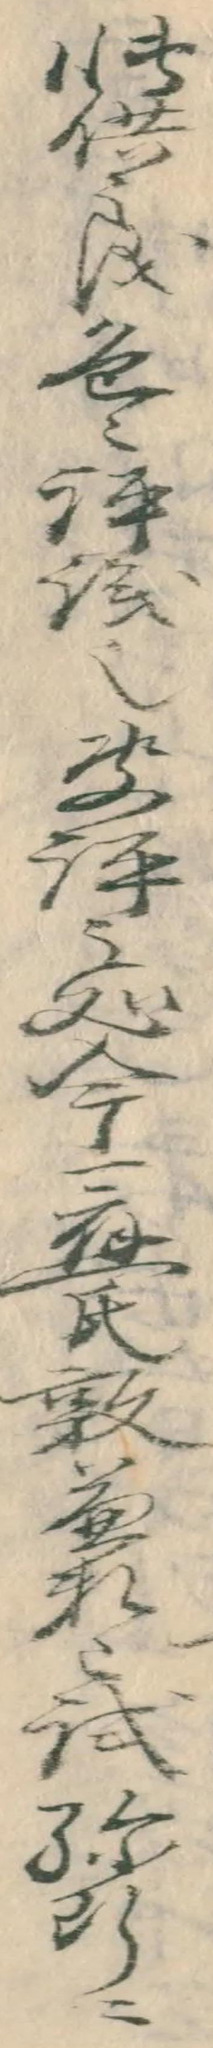轉供之儀色々評議之決評之処今一應氏敦兼頼被試弥断ニ
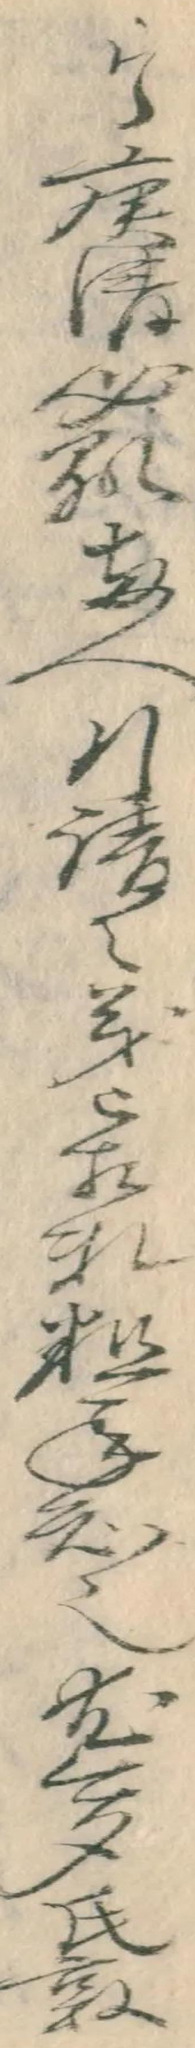庚清必顕両人引請之義被相頼粗承知也尤今夕氏敦
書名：賀茂社記録. 第66冊
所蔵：国立国会図書館 National Diet Library, JAPAN
